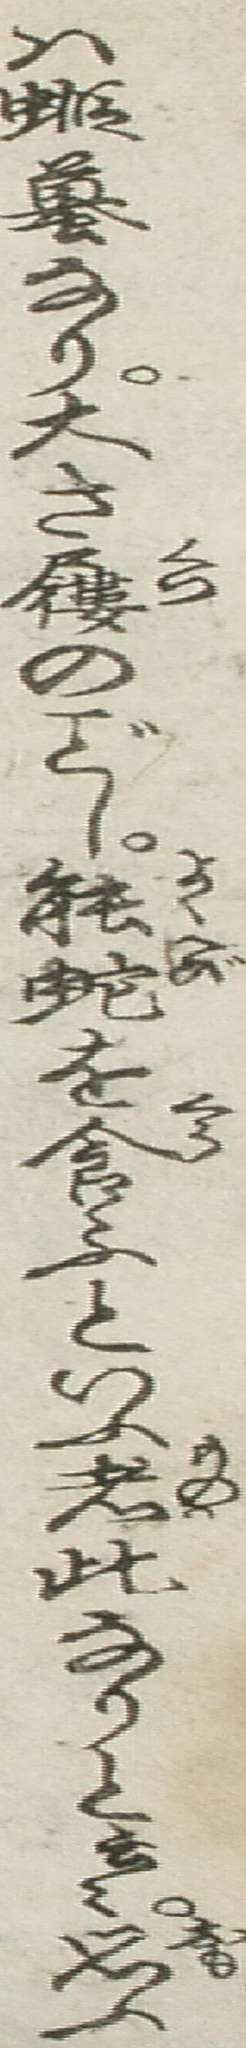は蝦蟇なり。大さ屨のごとし。能蛇を食ふといふ者。此なりと云〻。思ふ
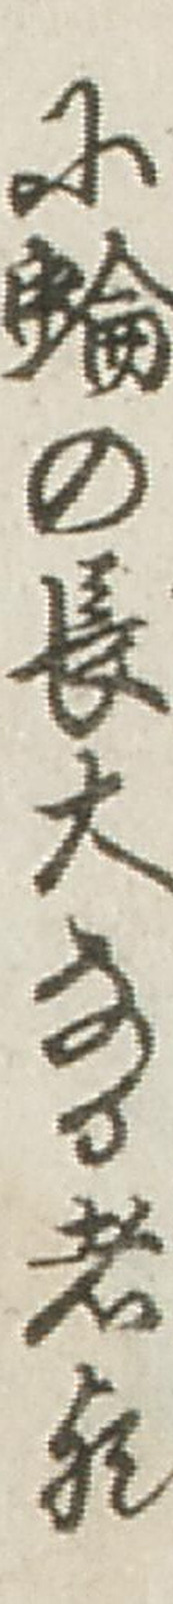に蜦の長大なる者歟
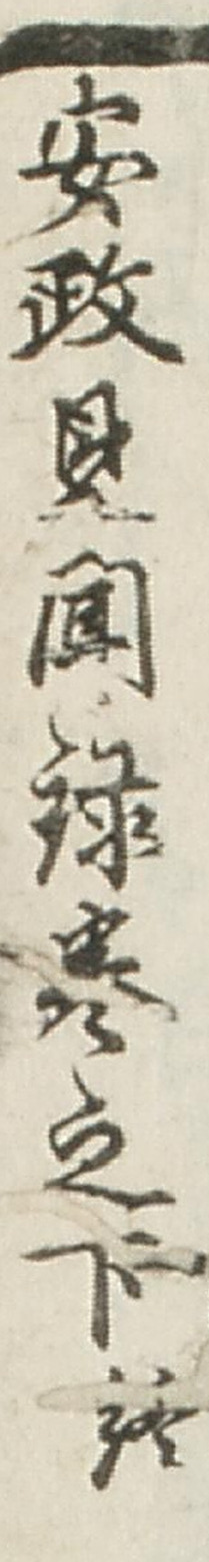安政見聞録巻之下終
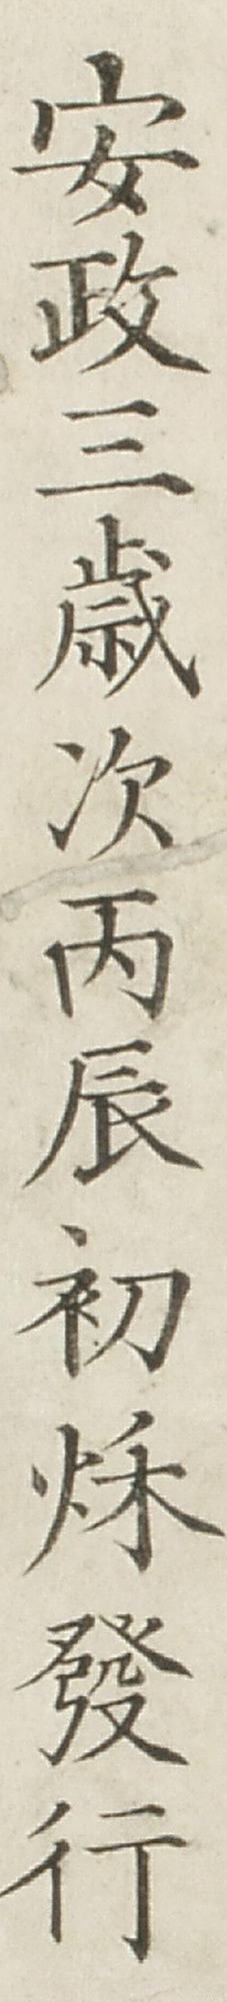安政三歳次丙辰初秋発行
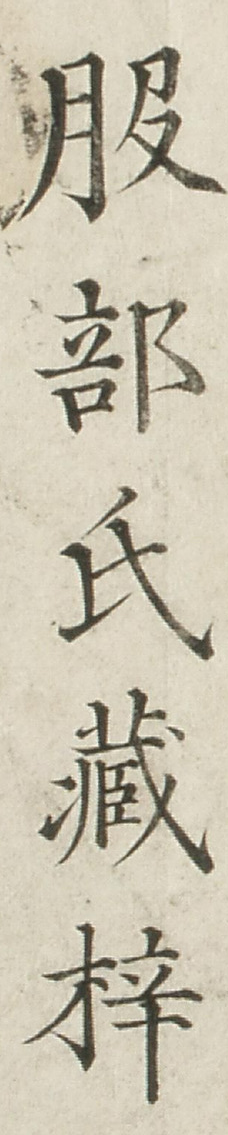服部氏蔵梓
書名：安政見聞録　下
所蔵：東京大学地震研究所図書室 Earthquake Research Institute Library, The University of Tokyo, JAPAN
